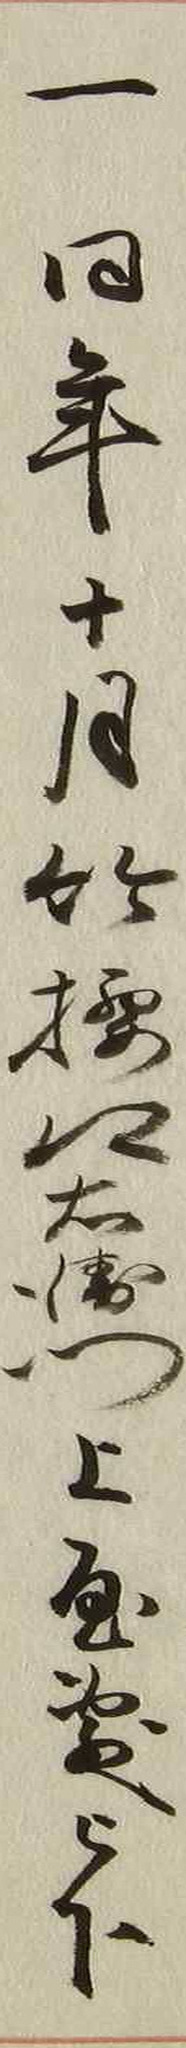一同年十月竹腰郷右衛門上屋敷被下
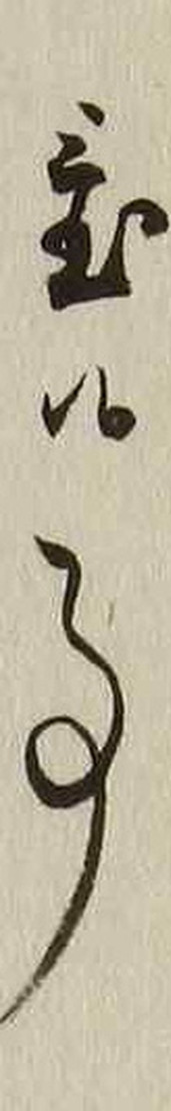置候事
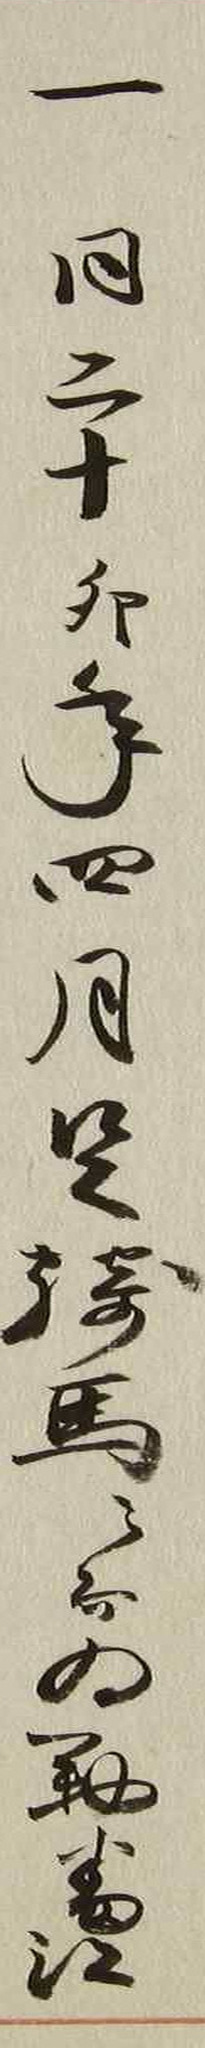一同二十卯年四月足崎馬ニ而為勤番江
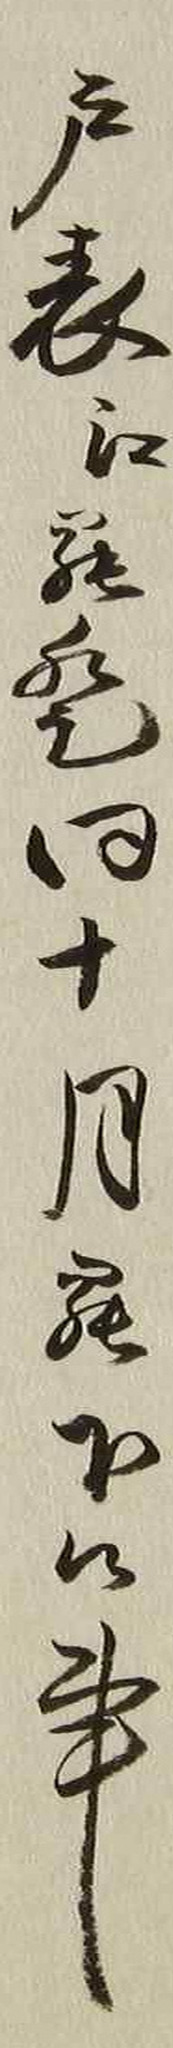戸表江罷登同十月罷下候事
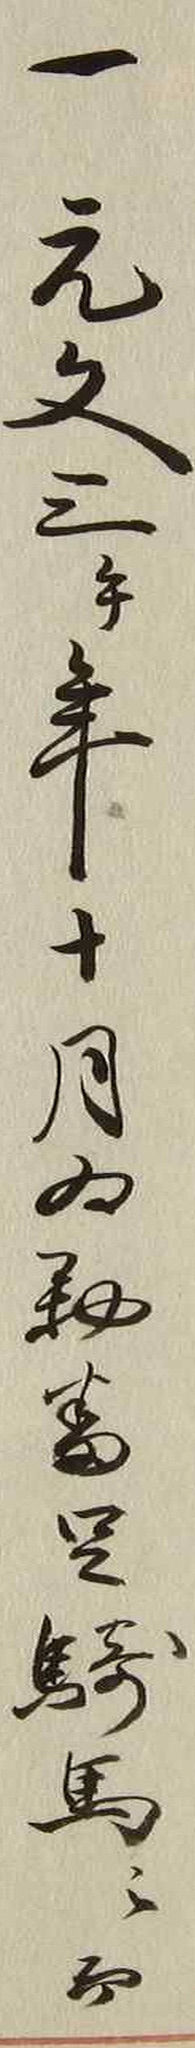一元文三午年十月為勤番足騎馬ニ而
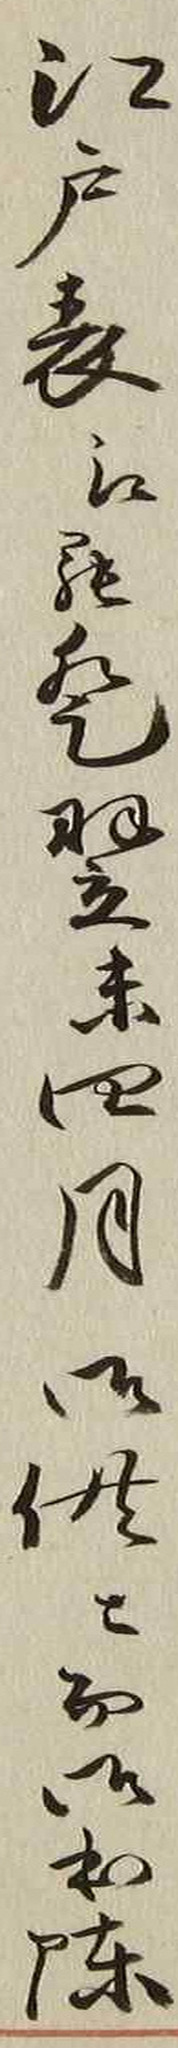江戸表江罷登翌未四月御供ニ而御本陣
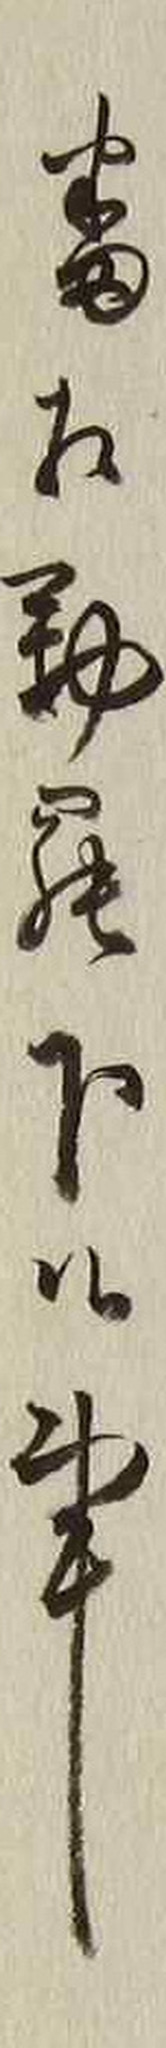番相勤罷下候事
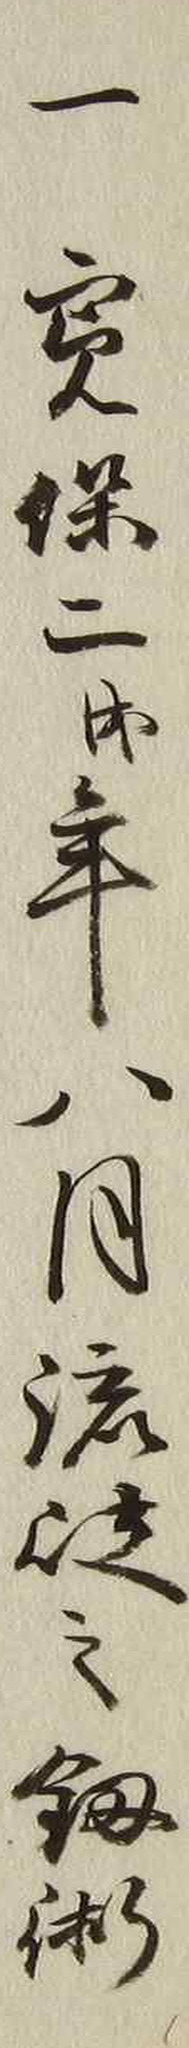一寛保二戌年八月流岐之剣術
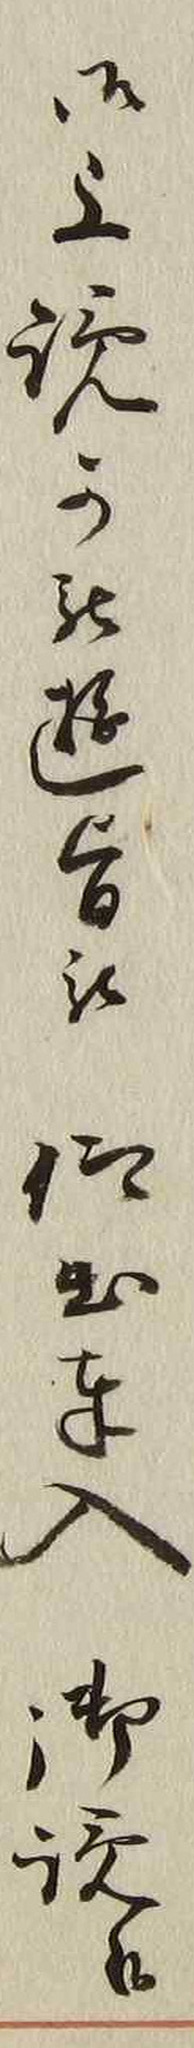御上覧可被遊旨被仰出奉入御覧候
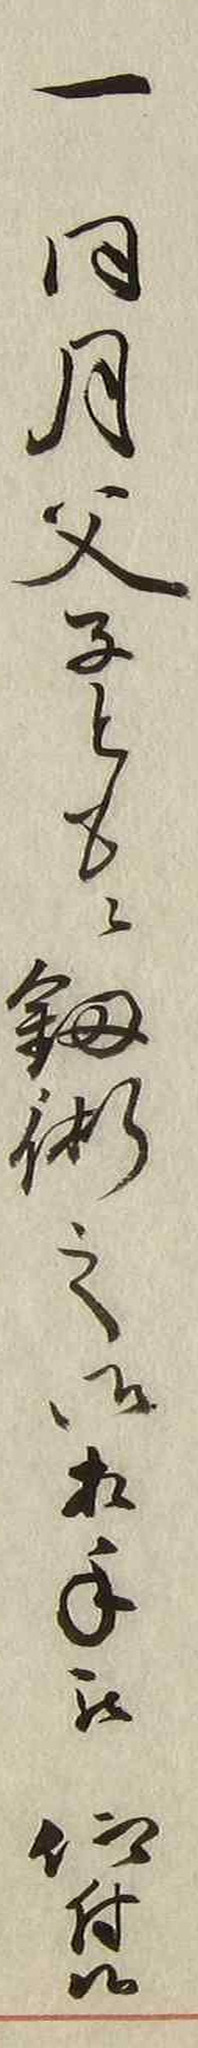一同月父子ともニ剣術之御相手被仰付候
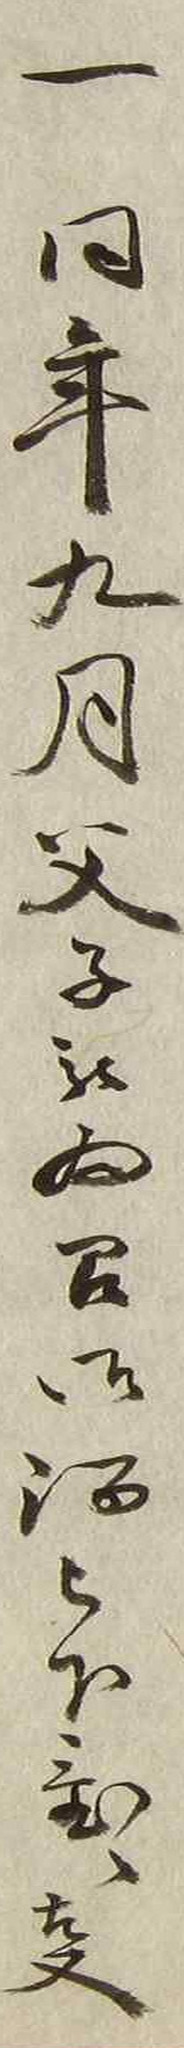一同年九月父子被為召御酒被下置候事
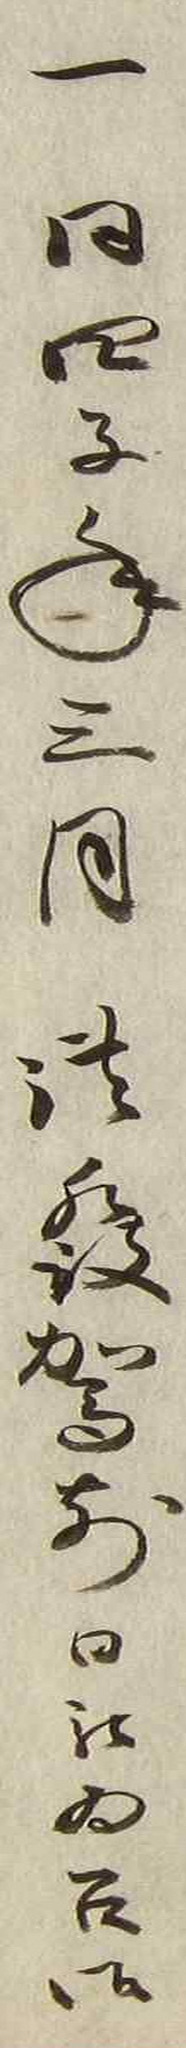一同四子年三月御発駕前日被為召御

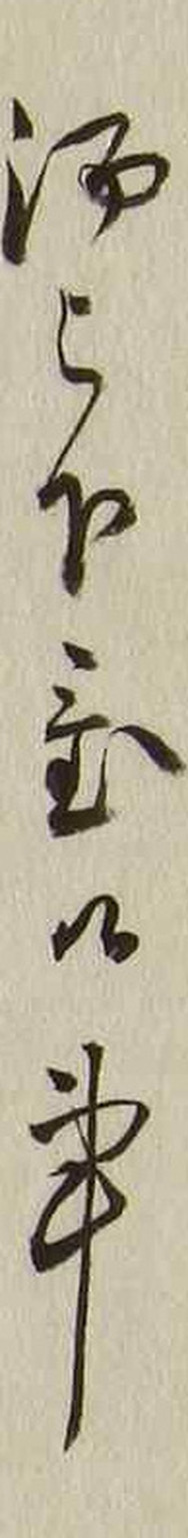酒被下置候事
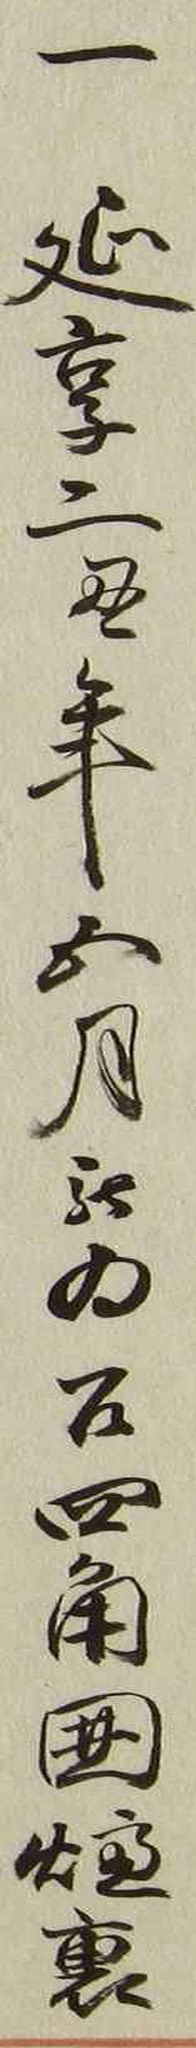一延享二丑年五月被為召四角囲炉裏
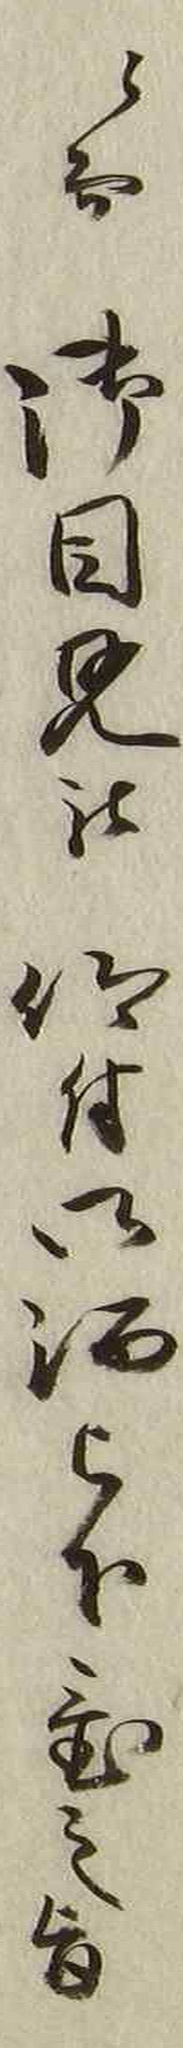ニ而御目見被仰付御酒被下置之旨
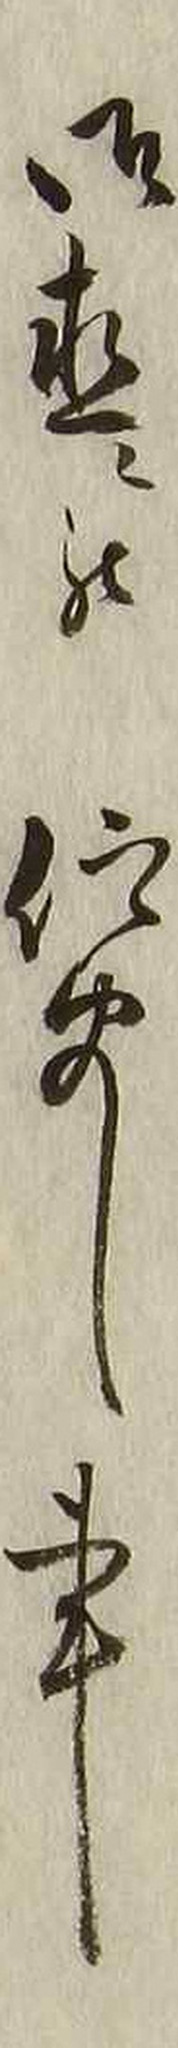御直ニ被仰聞候事
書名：諸士系譜　巻之15　い之部15
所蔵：会津若松市立会津図書館
